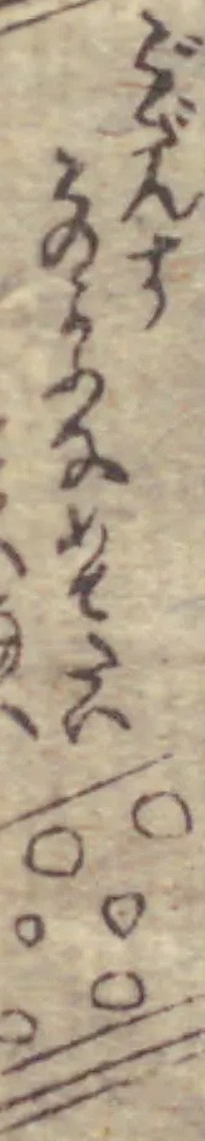このよふなめてたい
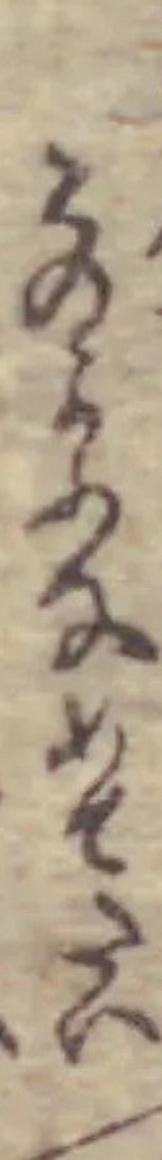このよふなめてたい
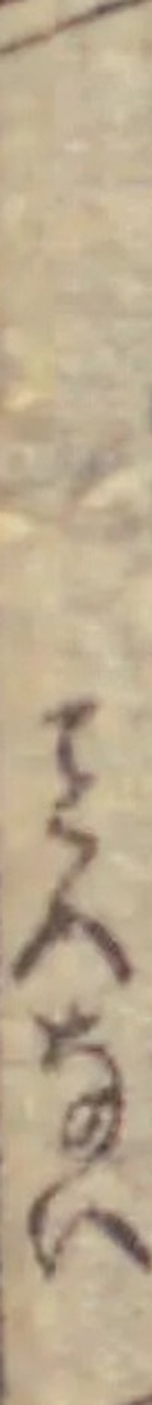ことはない
